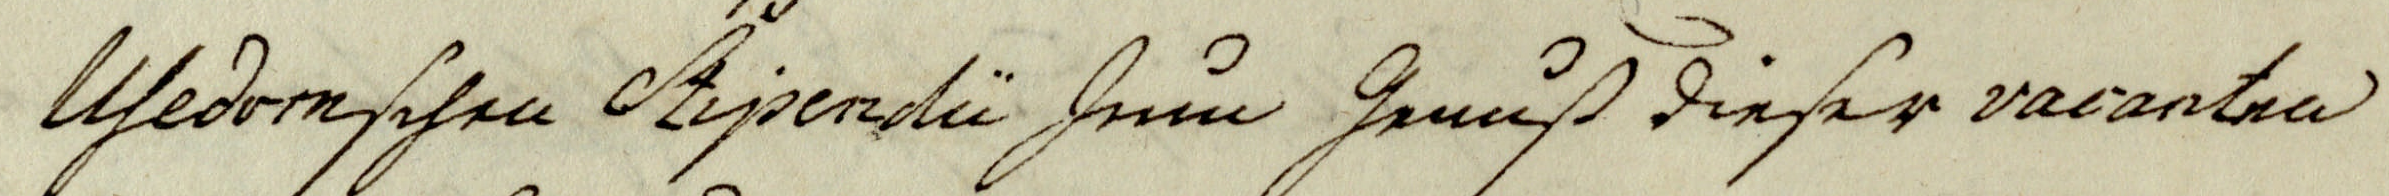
Usedomschen Stipendii zum genuß dieser vacanten
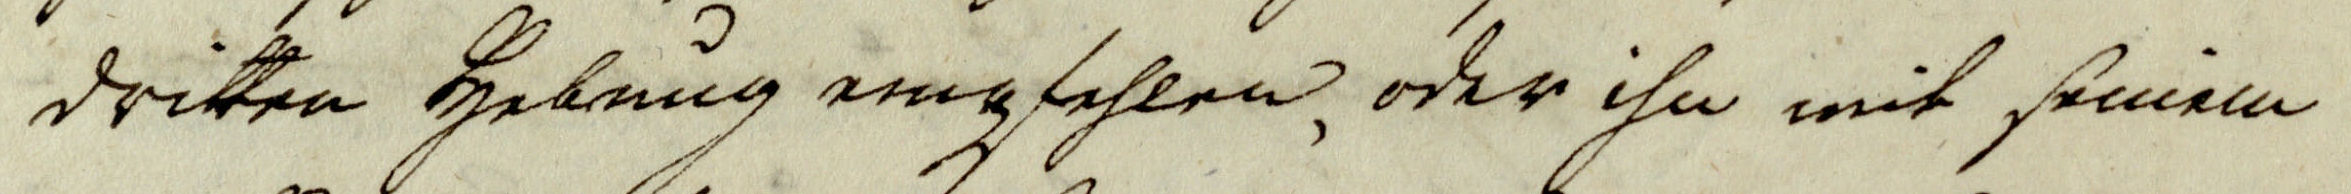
dritten Hebung empfehlen, oder ihn mit seinem
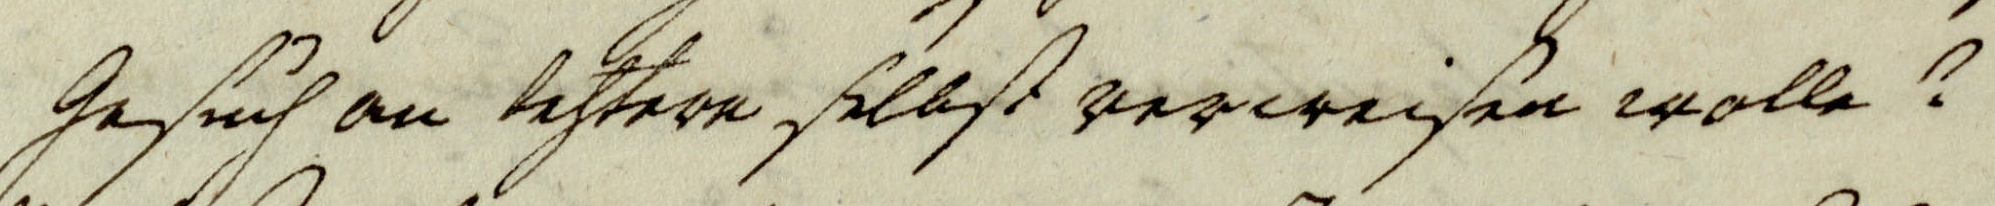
Gesuch an letztern selbst verweisen wolle?
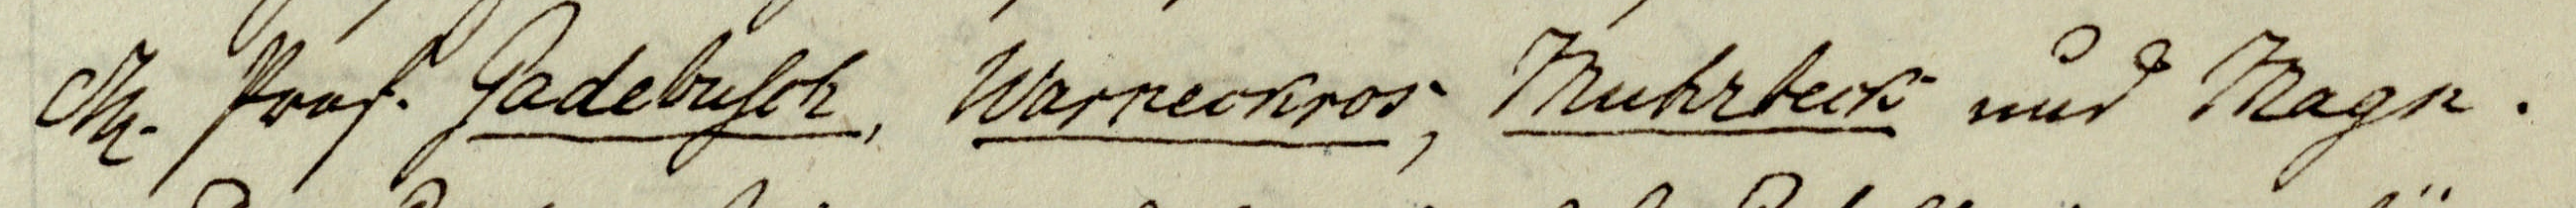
dh. Prof. Gadebusch, Warneckros, Muhrbeck und Magn.
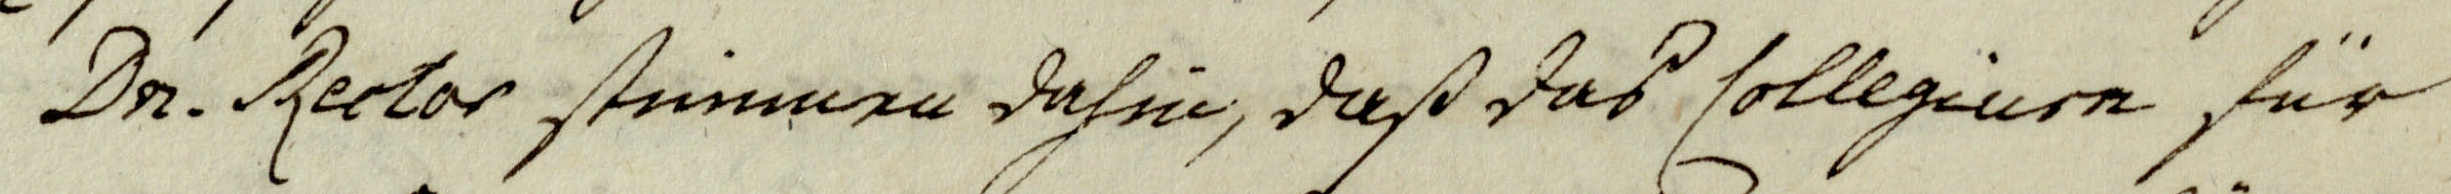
Dn. Rector stimmen dafür, daß das Collegium für
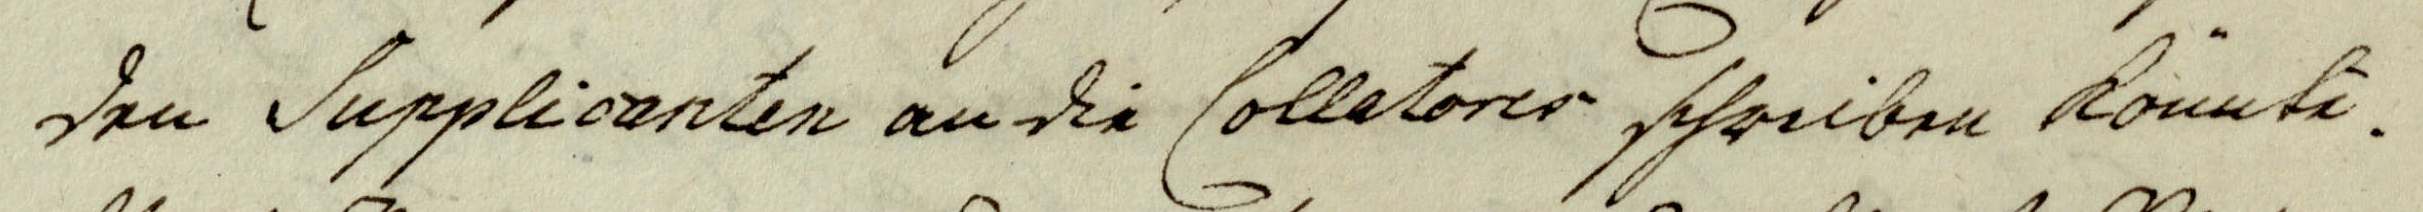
den Supplicanten an die Collatores schreiben könnte
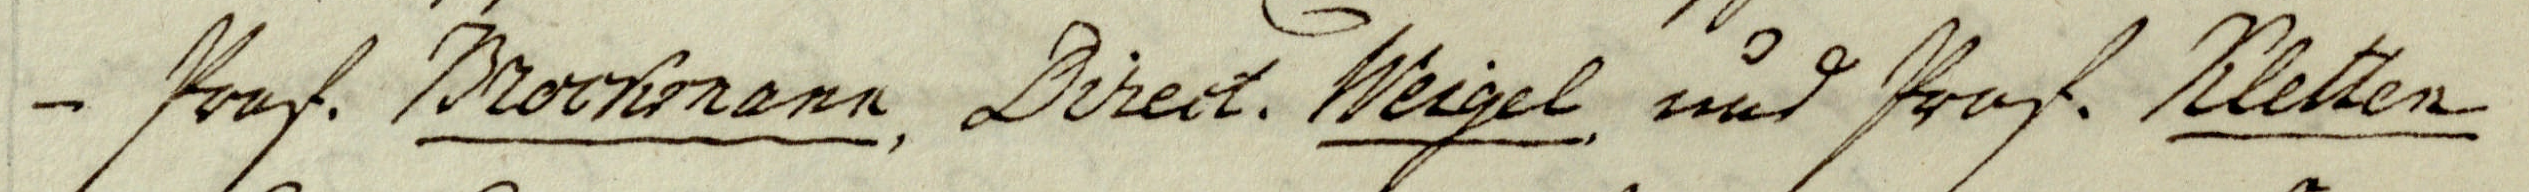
— Prof. Brockmann, Direct. Weigel und Prof. Kletten
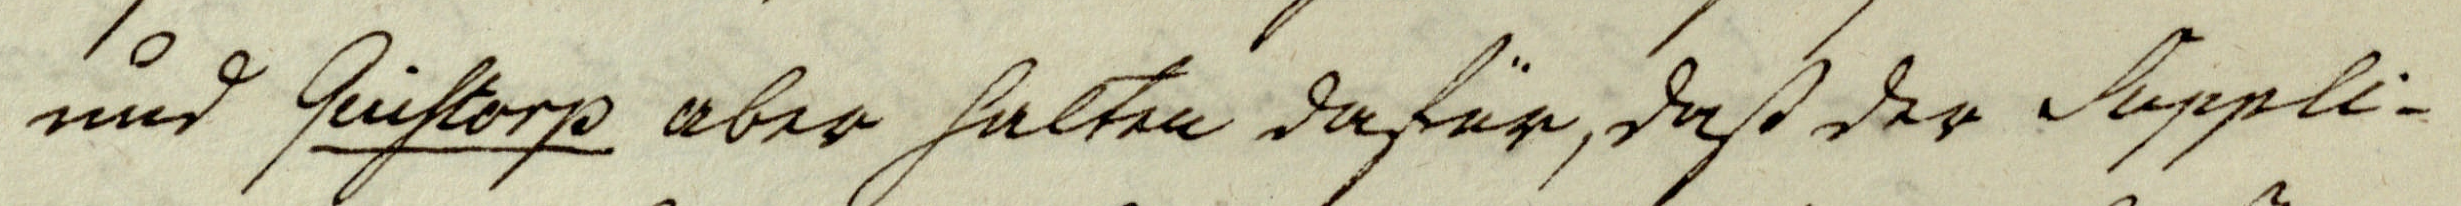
und Quistorp aber halten dafür, daß der Suppli¬
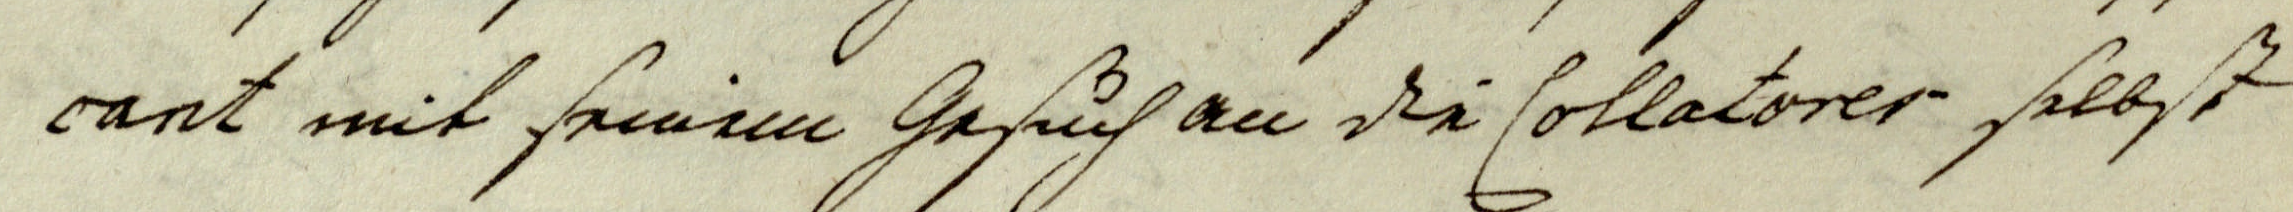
cant mit seinem Gesuch an die Collatores selbst
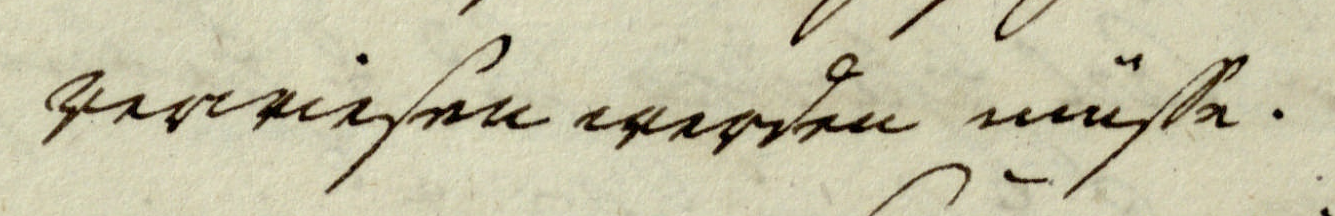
verweisen werden müsse.
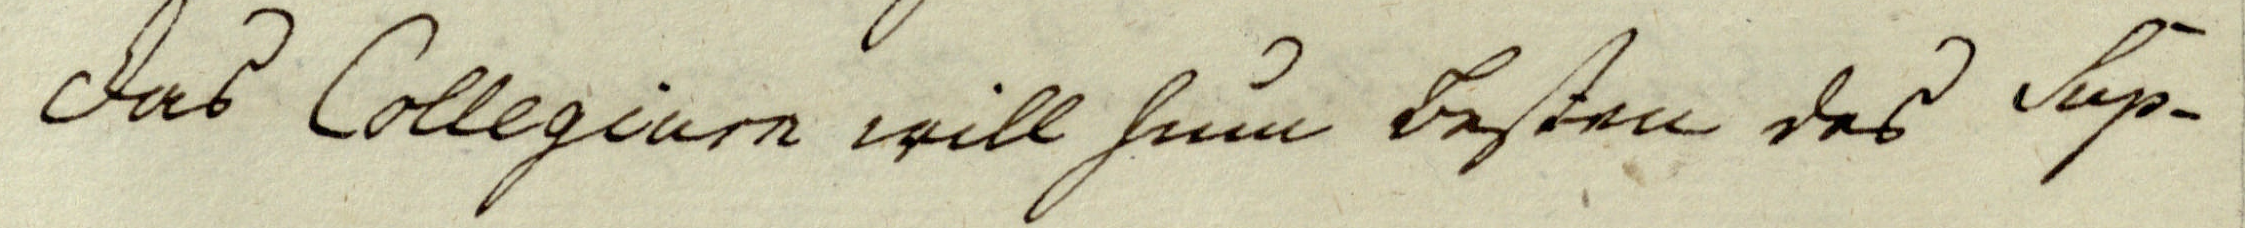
Das Collegium will zum Besten des Sup¬
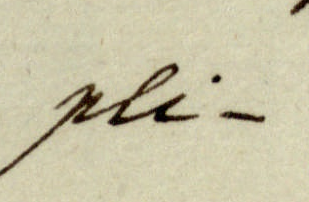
pli¬
